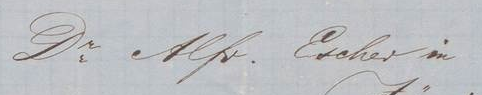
Herrn Dr Alfr. Escher in
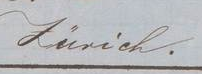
Zürich
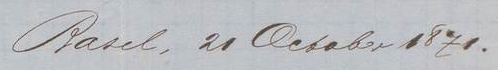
Basel, 21 October 1871.
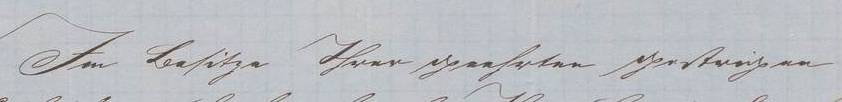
Im Besitze Ihrer geehrter gestrigen
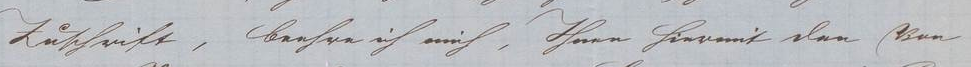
Zuschrift, beehre ich mich, Ihnen hiermit den von
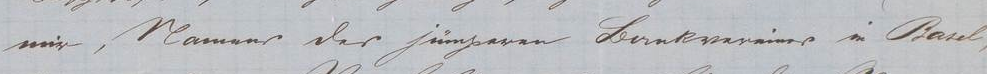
mir, Namens des jüngeren Bankvereines in Basel,
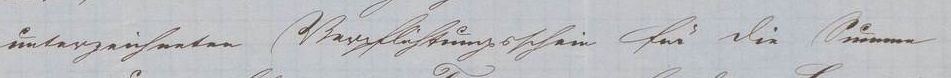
unterzeichneten Verpflichtungsschein für die Summe
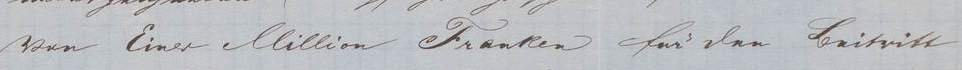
von Einer Million Franken für den Beitritt
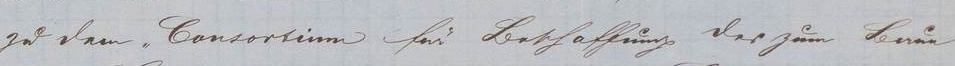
zu dem «Consortium für Beschaffung des zum Baue
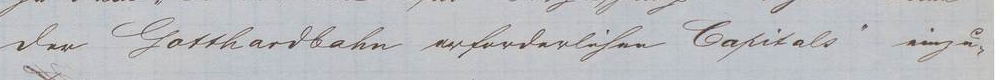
der Gotthardbahn erforderlichen Capitals» einzu-
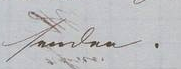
senden. –
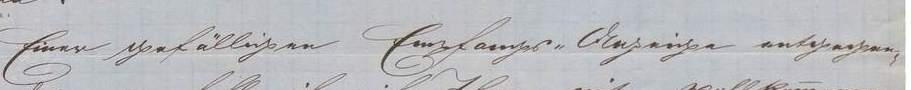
Einer gefälligen Empfangs–Anzeige entgegen-
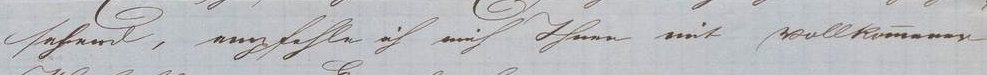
sehend, empfehle ich mich Ihnen mit vollkommener
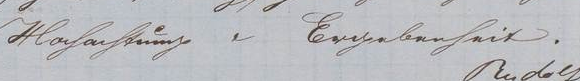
Hochachtung & Ergebenheit.
